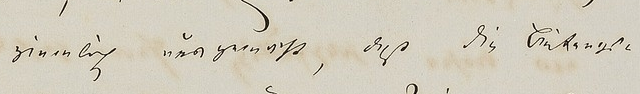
ziemlich ausgemacht, daß die Beitrags-
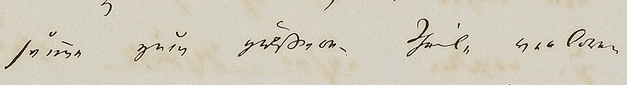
summe zum größeren Theile verloren
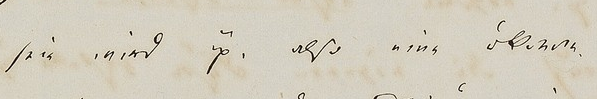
sein wird &. also eine ökonom.
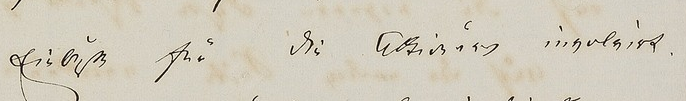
Einbuße für die Aktionärs involvirt.
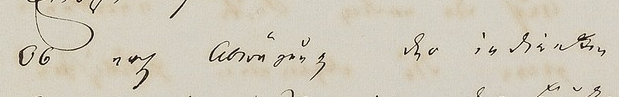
Ob nach Abwägung der indirekten
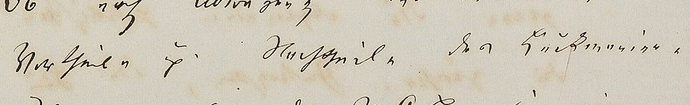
Vortheile &. Nachtheile des Luckmanier-
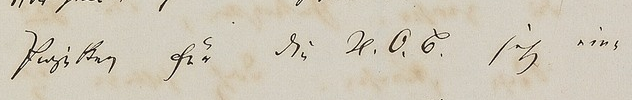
Projektes für die N.O.B. sich eine
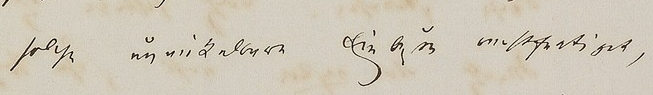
solche unmittelbare Einbuße rechtfertiget,
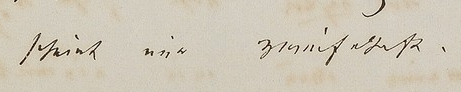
scheint mir zweifelhaft.
